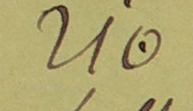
210
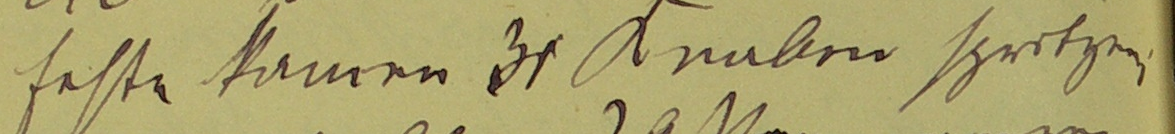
feste kamen 31 Knaben spritzen
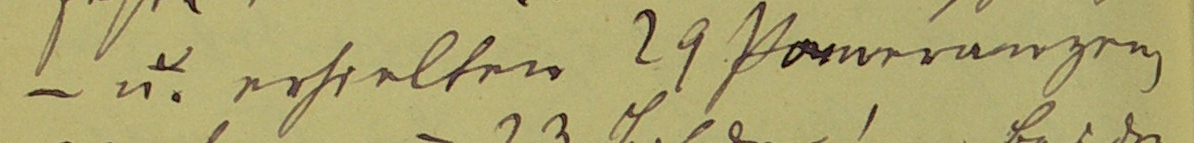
- und erhielten 29 Pommeranzen,
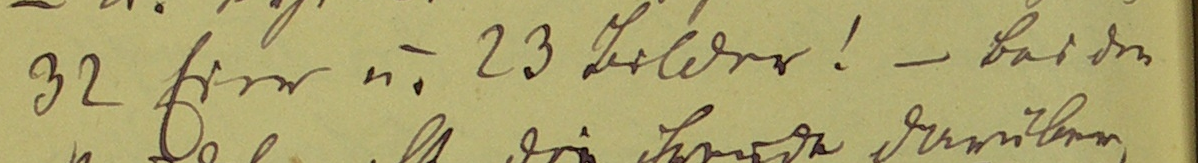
32 Eier und 23 Bilder!- Bei den
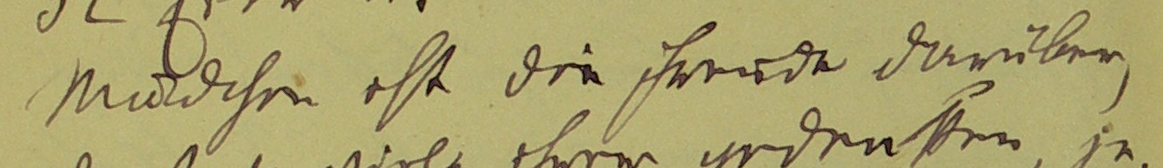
Mädchen ist die Freude darüber,
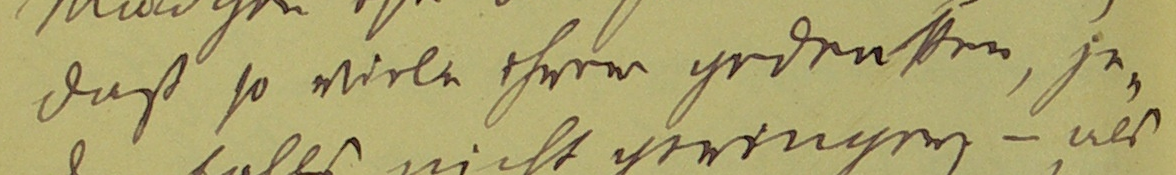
daß so viele ihrer gedenken, ja je¬
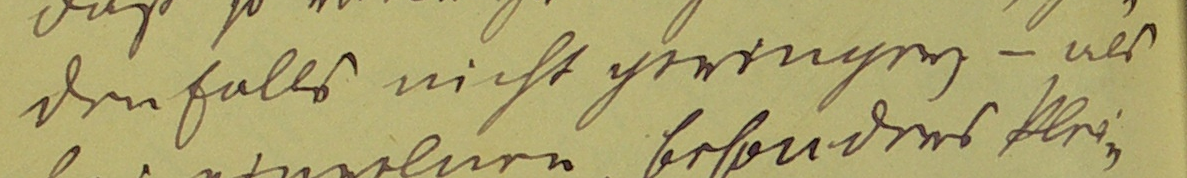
denfalls nicht geringer –als
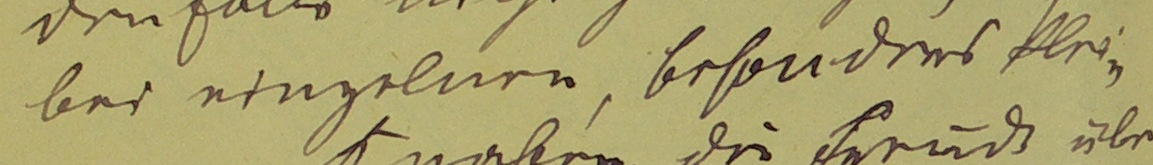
bei einzelnen, besonders klei¬
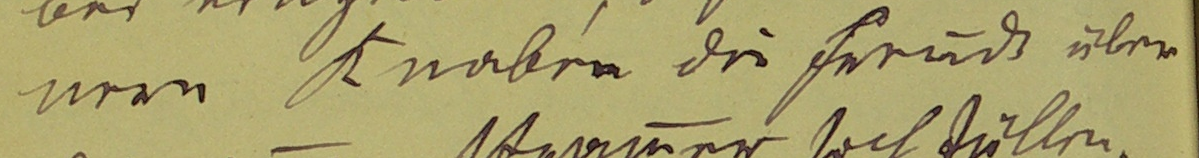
nen Knabe die Freude über
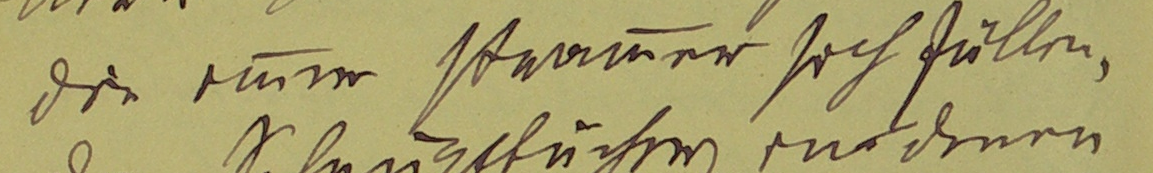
die immer strammer sich füllen¬
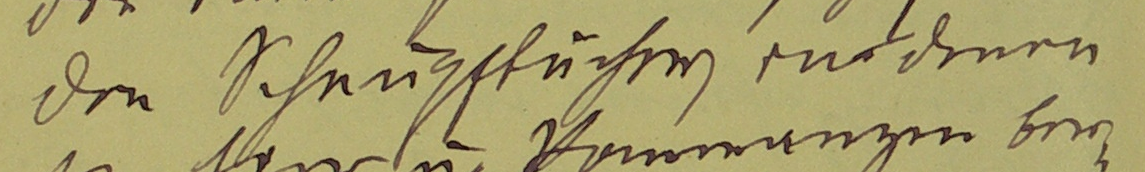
den Schnupftücher, in denen
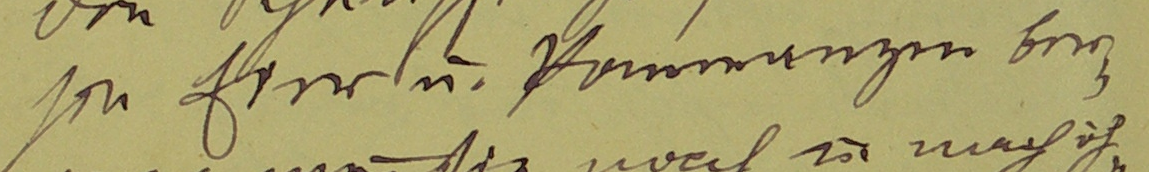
sie Eier und Pommeranzen ber¬
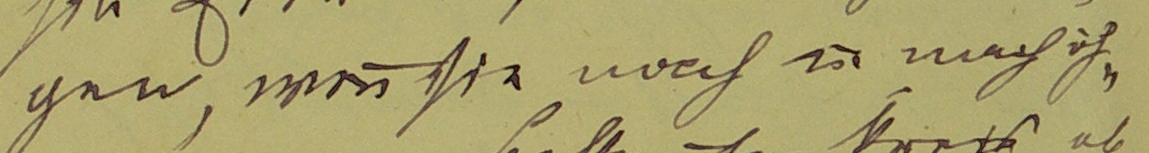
gen, wie sie nach und nach ih¬
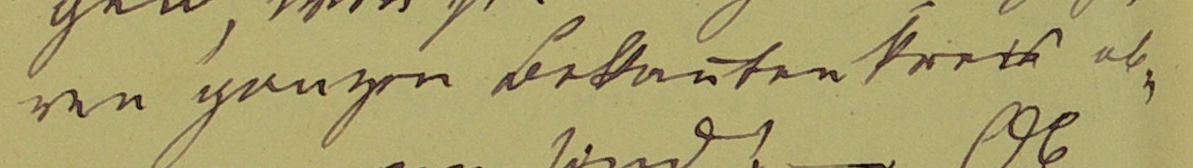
ren ganzen Bekanntenkreis ab¬
